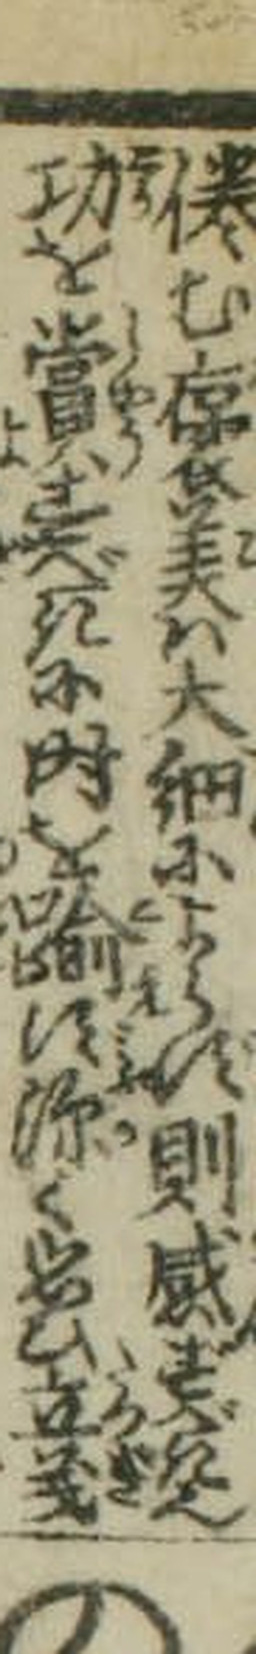功を賞すべきに時を踰ず深く思ひ立義
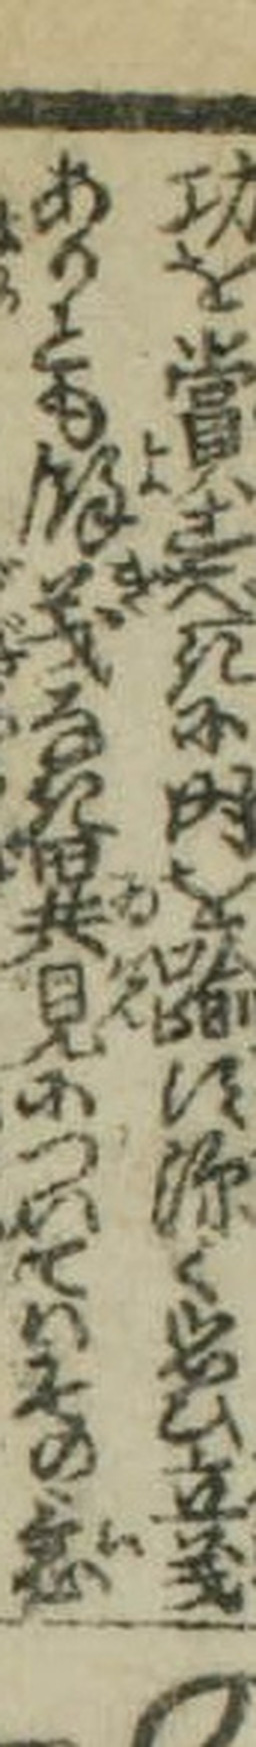ありとも餘義なき異見についてはその意
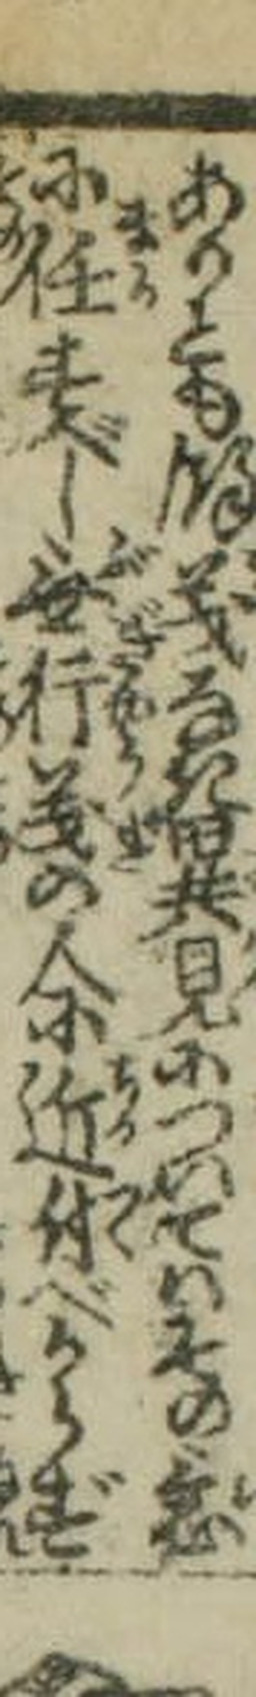に任すべし無行義の人に近付べからず
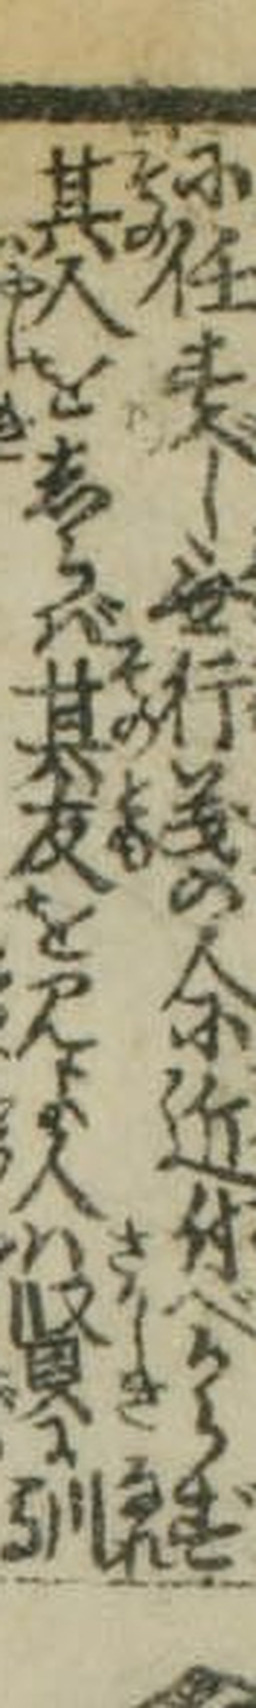其人をしらば其友を見よ人は賢に馴
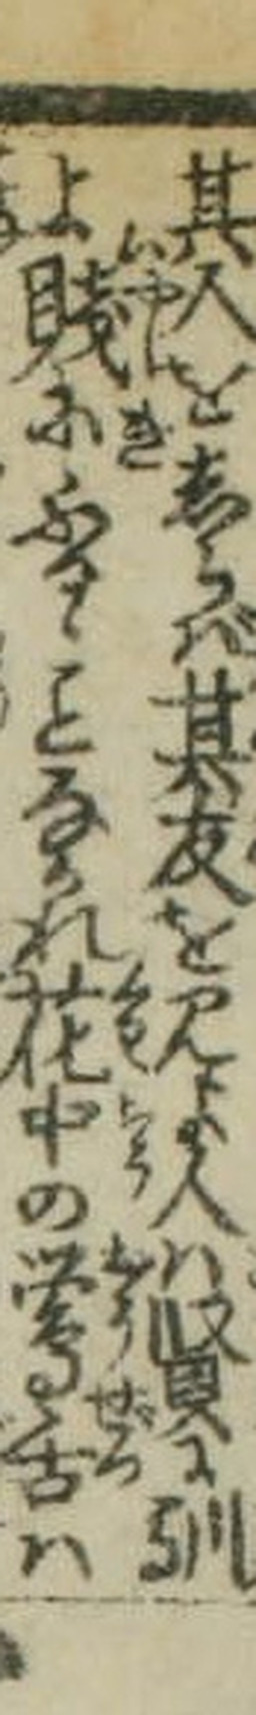よ賎にふるゝことなかれ花中の鶯舌は
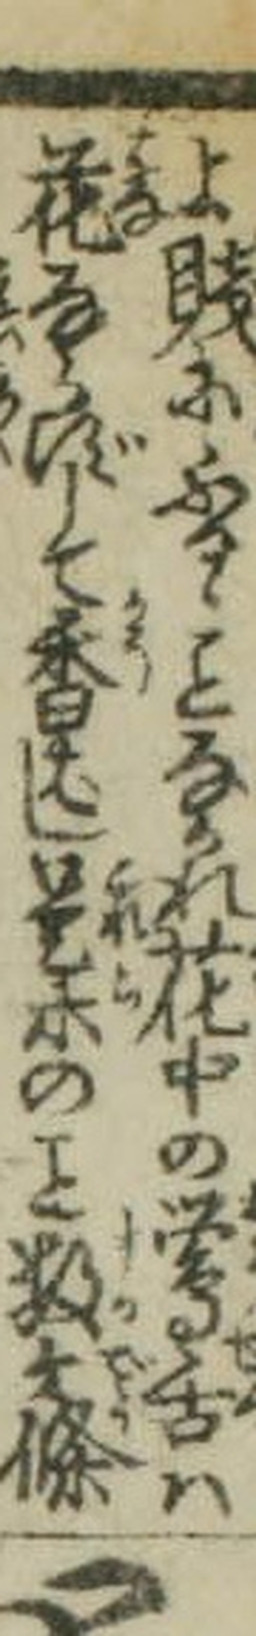花ならずして香ばし是等のこと数ケ條
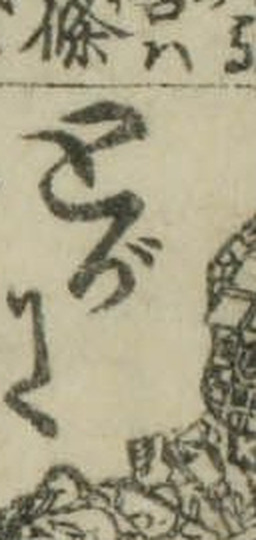とがに
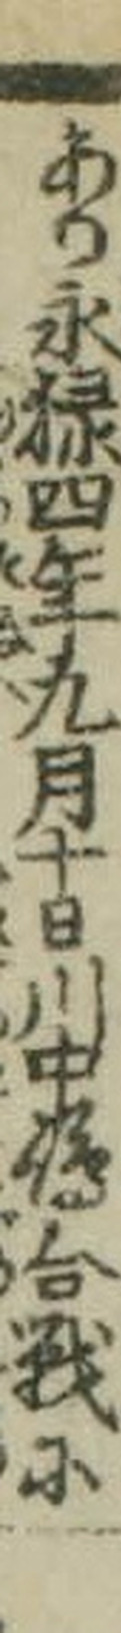あり永禄四年九月十日川中嶋合戦に
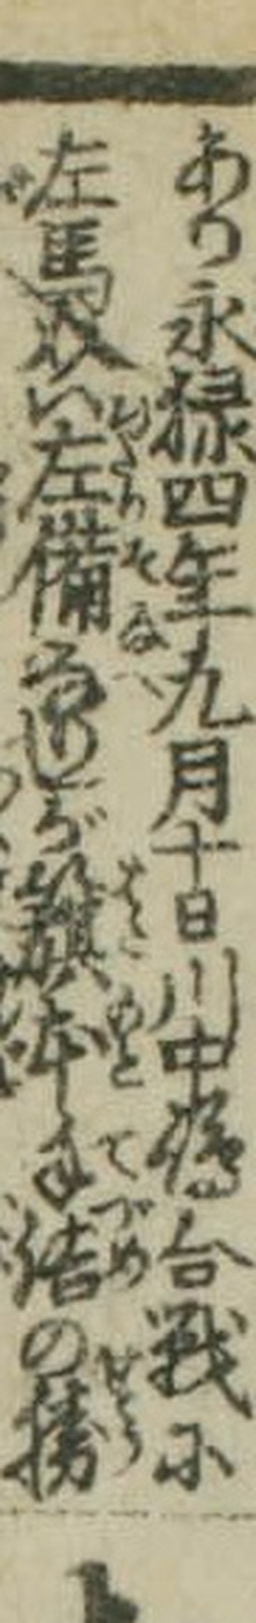左馬介は左備なりしが籏本手詰の勝
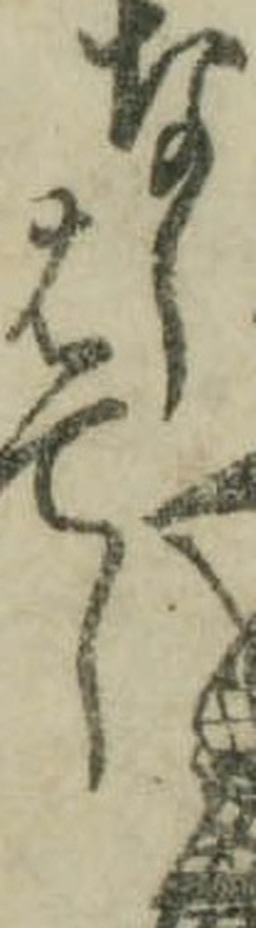はてし
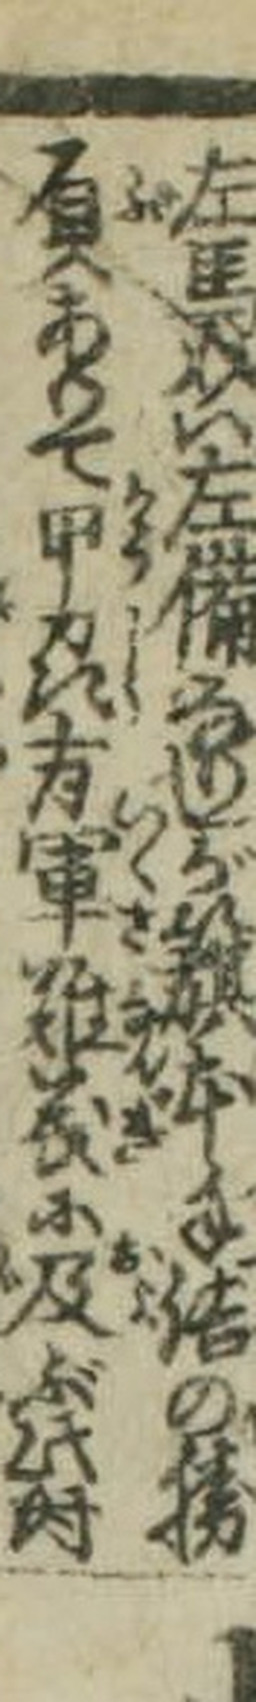負ありて甲州方軍難義に及ぶ此時
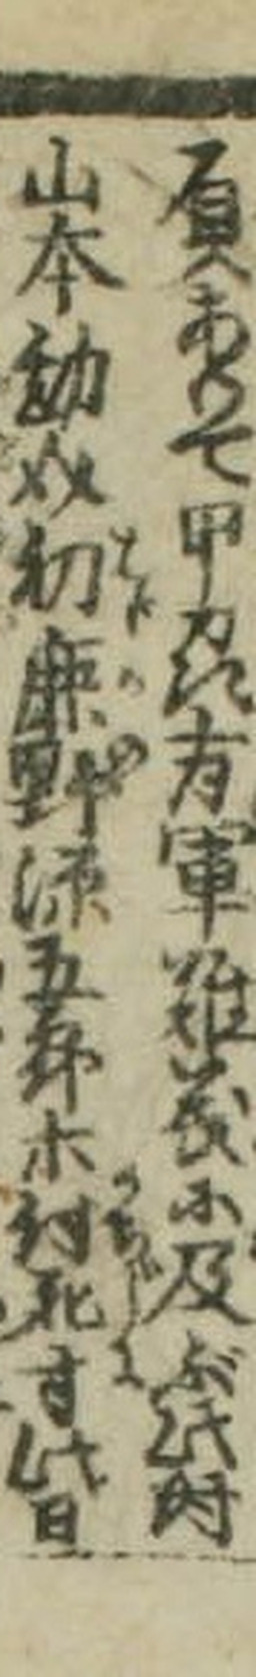山本勘介初鹿野源五郎等討死す此日
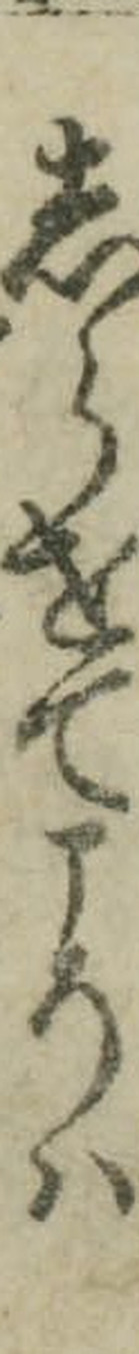しらせてこそは
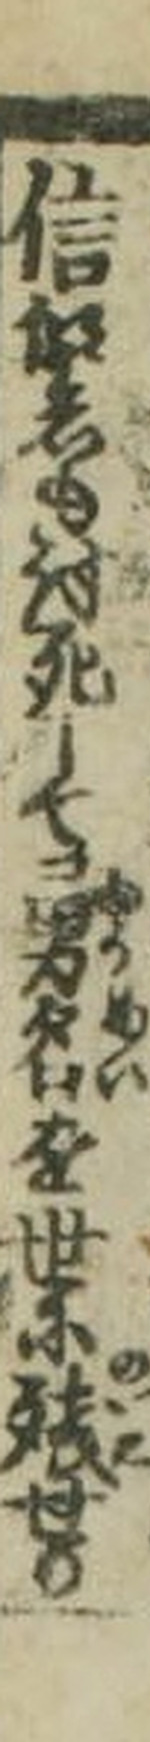信繁も討死して勇名を世に残せり
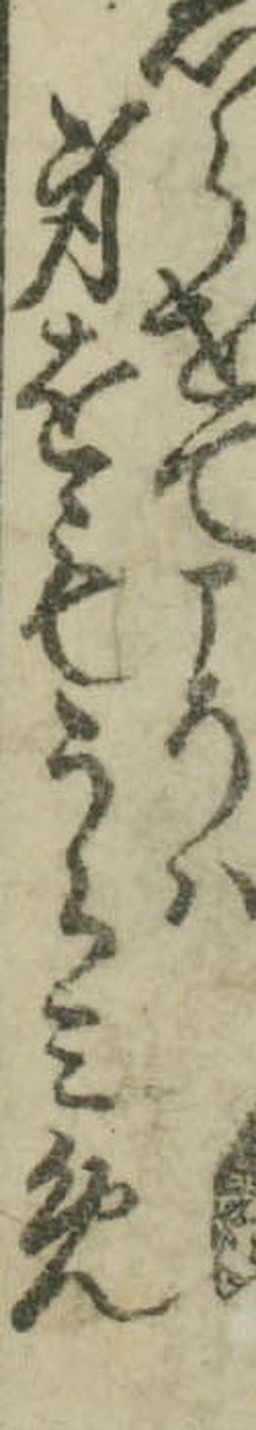身をもうらみめ
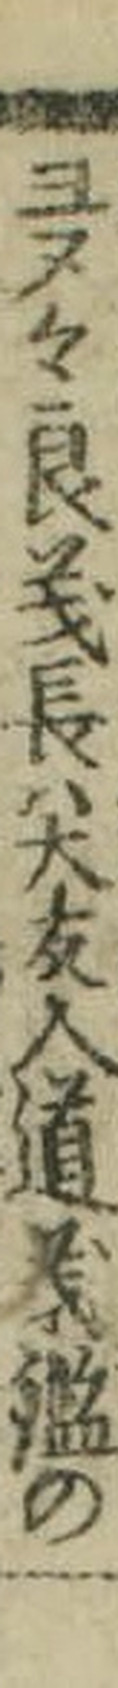多々良義長は大友入道義鑑の
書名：續英雄百人一首
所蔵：東京学芸大学附属図書館
